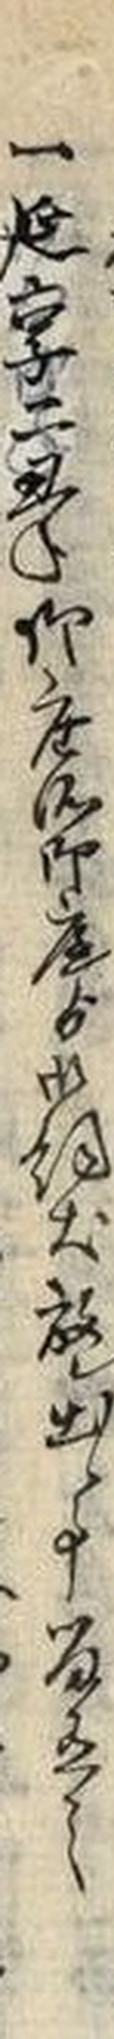一延享二丑年御座所御庭ゟ御飼犬放レ出候事留有之
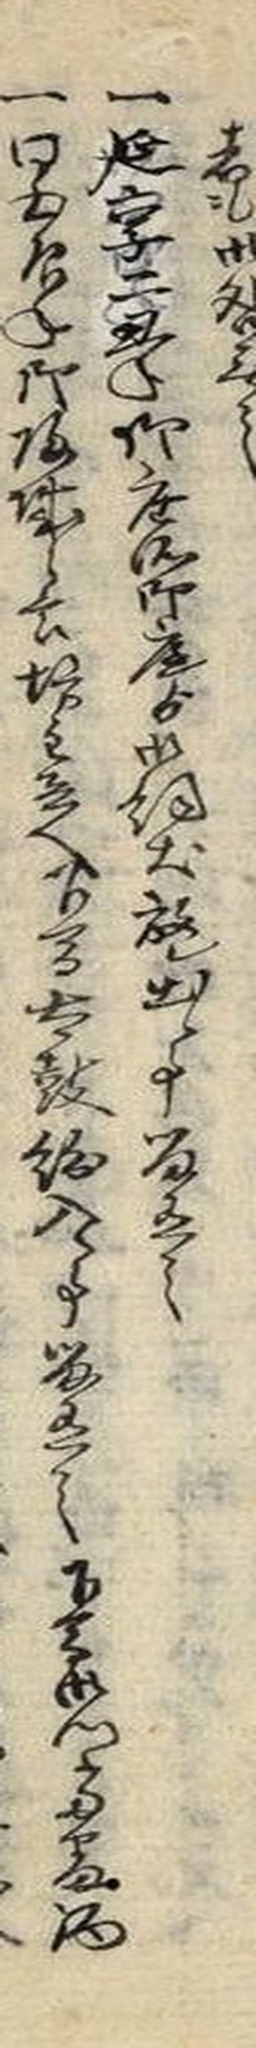一同五辰年御帰城之節坊主壱人下馬太鼓紛入候事留有之下馬御門当番酒
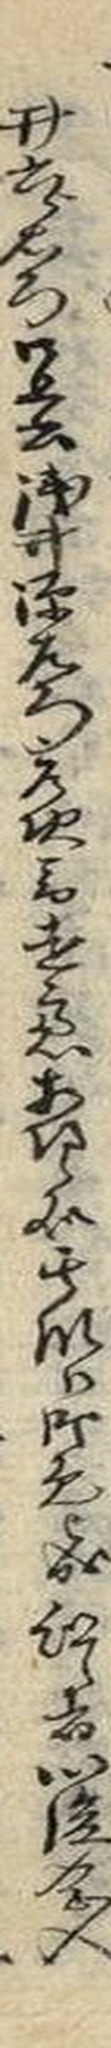井六郎右衛門口上書浅井源左衛門取次ニ而遠慮相伺候処其段ハ御免被成組之者以後念入
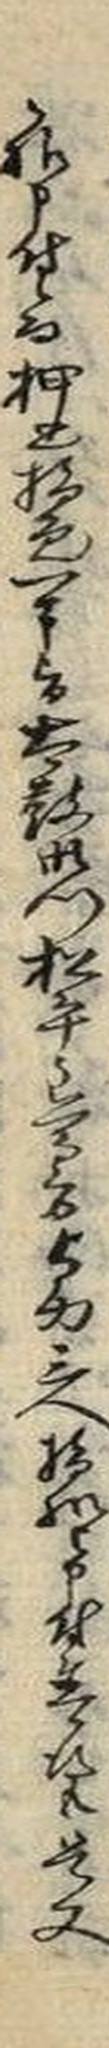候様申付候而押込指免可申旨太鼓御門松平主馬方与力三人指扣被申付置候得共是又
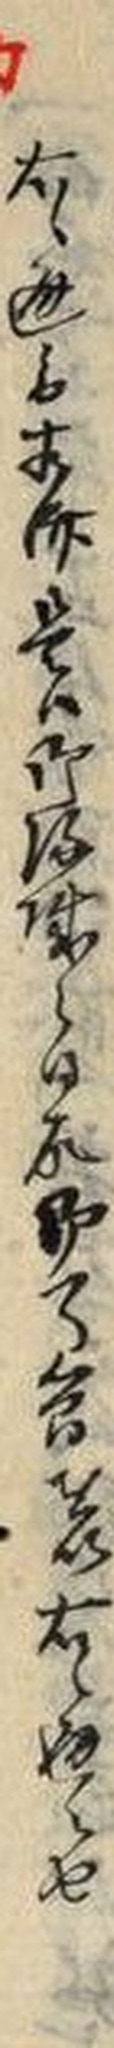右之通ニ而相済是ハ御帰城之日故御了簡を以右之通之由

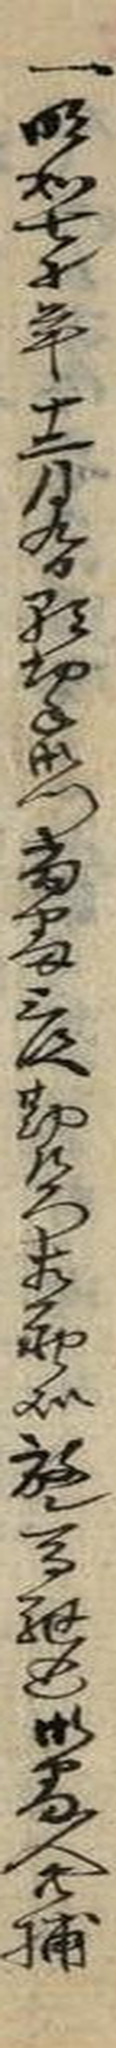一明和七寅年十二月九日朝切手御門当番三沢勘左衛門相勤候処放レ馬駆込御番人共捕
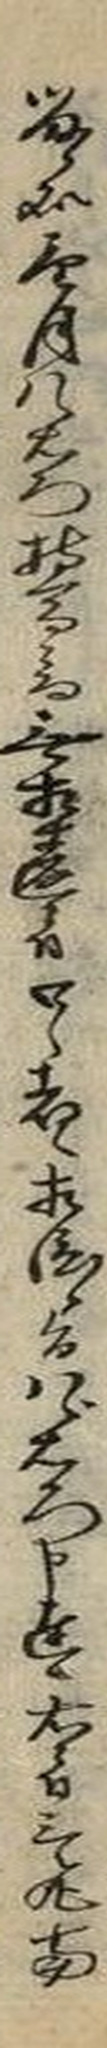留候処望月八郎右衛門持馬ニ而無相違ニ付口之者へ相渡候旨八郎右衛門申達候右ニ付三之丸南
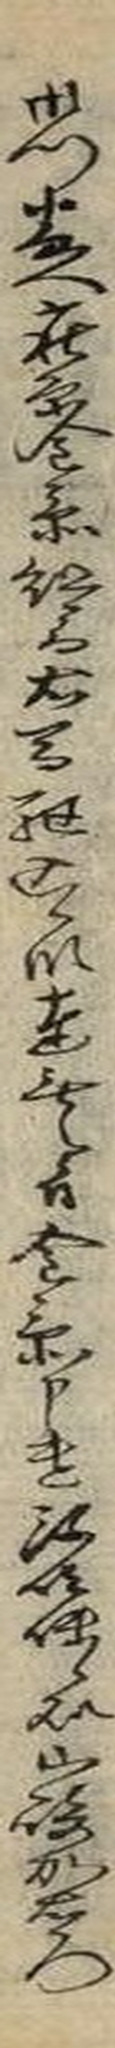御門番人萩原金兵衛組ニ而右馬駆込候段達無之ニ付金兵衛申遣致吟味候処山崎加右衛門
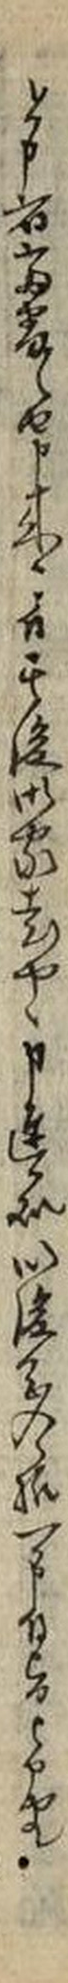と申者当番之由申来候ニ付其後御家老中へ申達候処以後念入候様可申付旨被申聞候
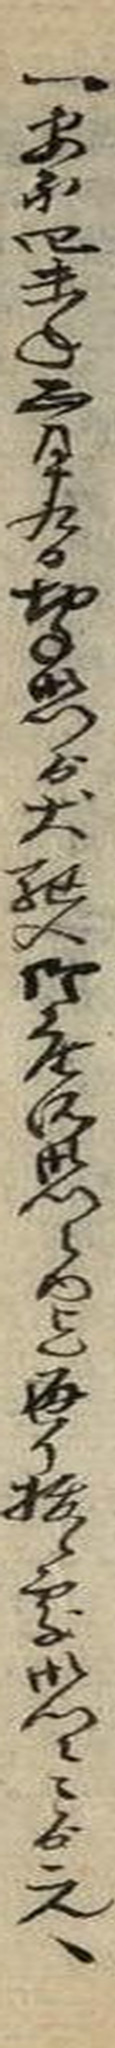一安永四未年正月十九日切手御門ゟ犬駆入御座所御門之内迄通り抜候処御門々々ゟ元へ
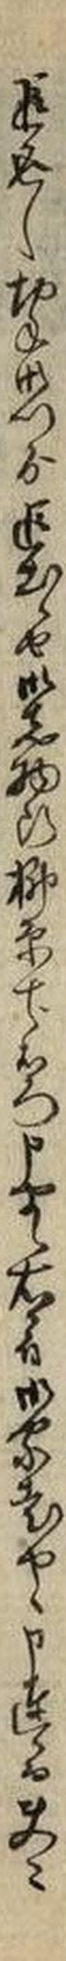追返し切手御門ゟ追出候由御先物頭榊原十郎右衛門申聞候右ニ付御家老中へ申達候而夫々
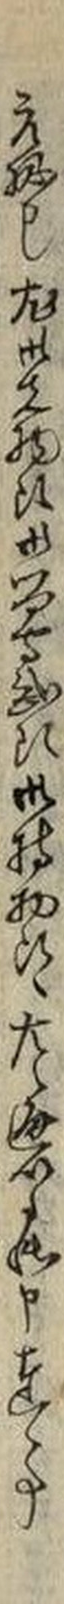取扱申候尤御先物頭御留守武頭御持物頭へ左之通以手紙申達候事
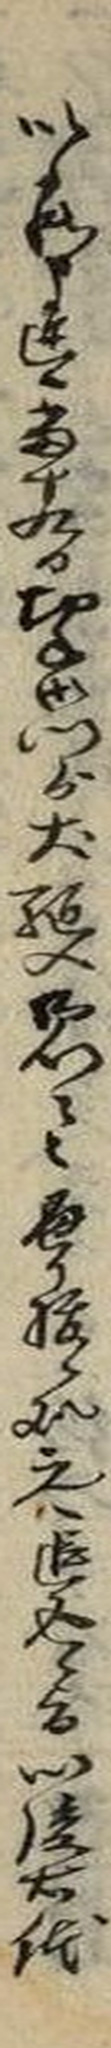以手紙申達候当十九日切手御門ゟ犬駆入御門々々通り抜候処元へ追返候旨以後右体
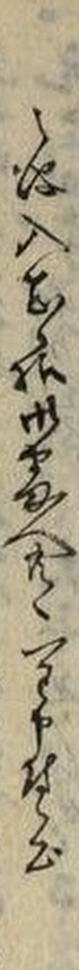之儀入念候様御番人共へ可被申付候以上
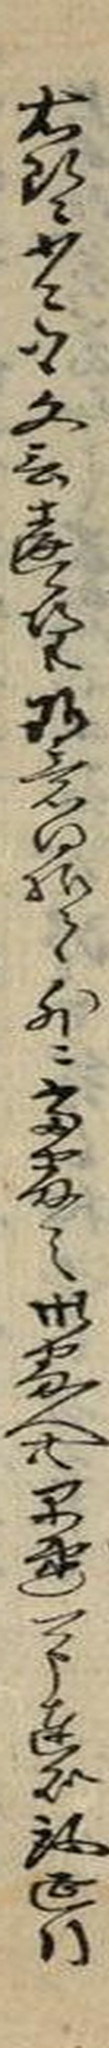右頭々少々ツヽ文言違候得共趣意同様ニ候外ニ当番之御番人共早速可申達処致延引
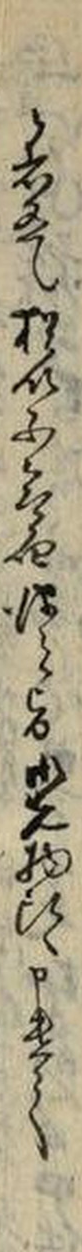候者有之猶以不参届儀ニ候旨御先物頭へ申遣之
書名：御門御櫓之部
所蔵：福井県文書館 Fukui Prefectural Archives
